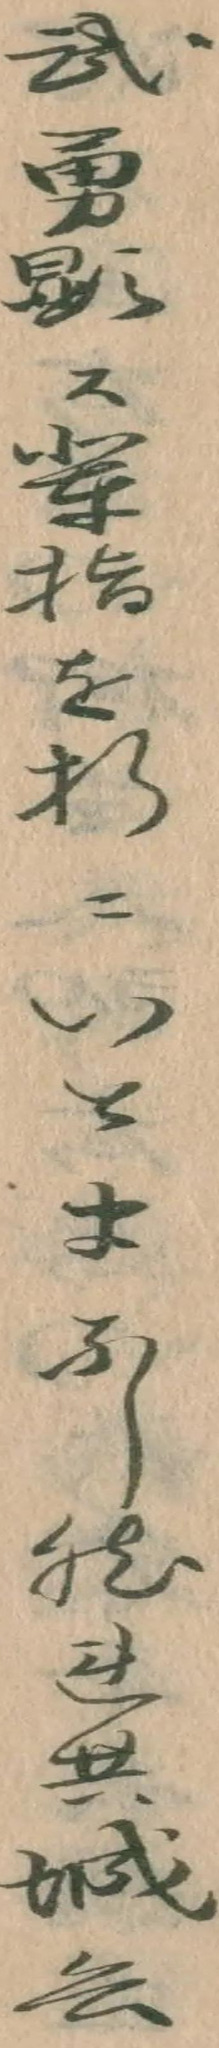武勇顕す輩指を折にいとまなし然連共城兵
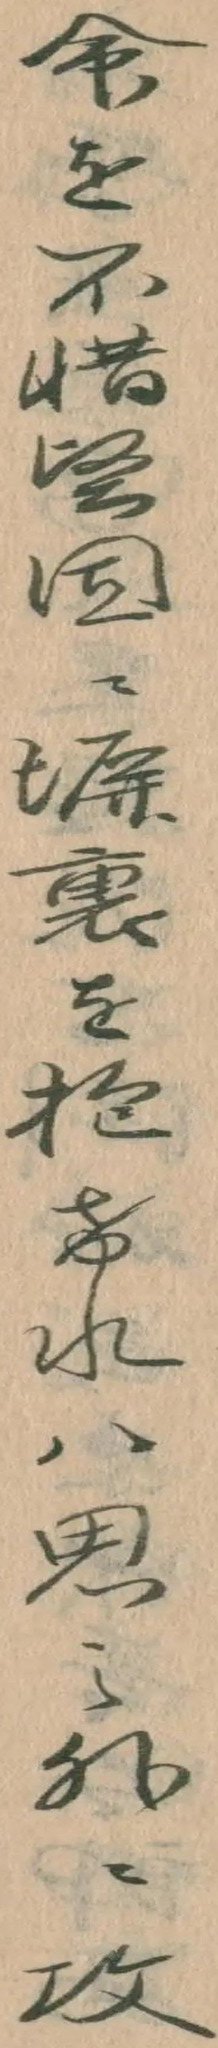命を不惜堅固に塀裏を抱希れは思之外に攻
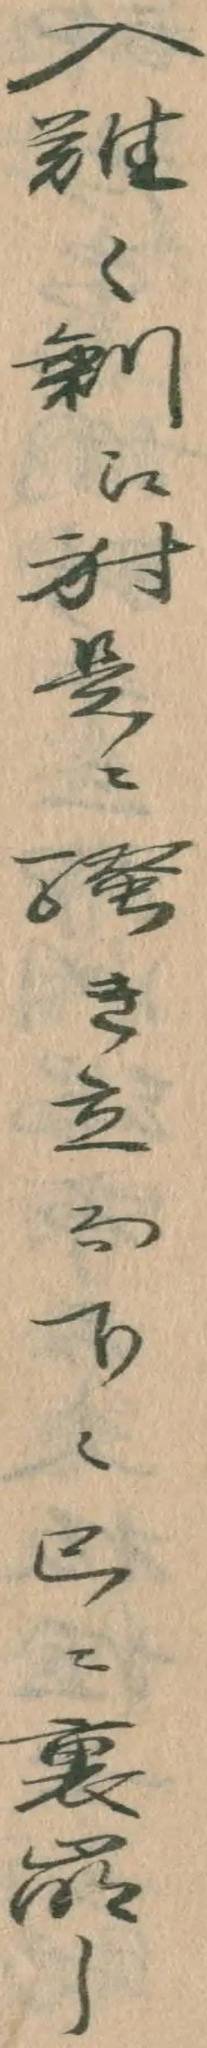入難き剰江射是に騒き立而下々巳に裏崩し
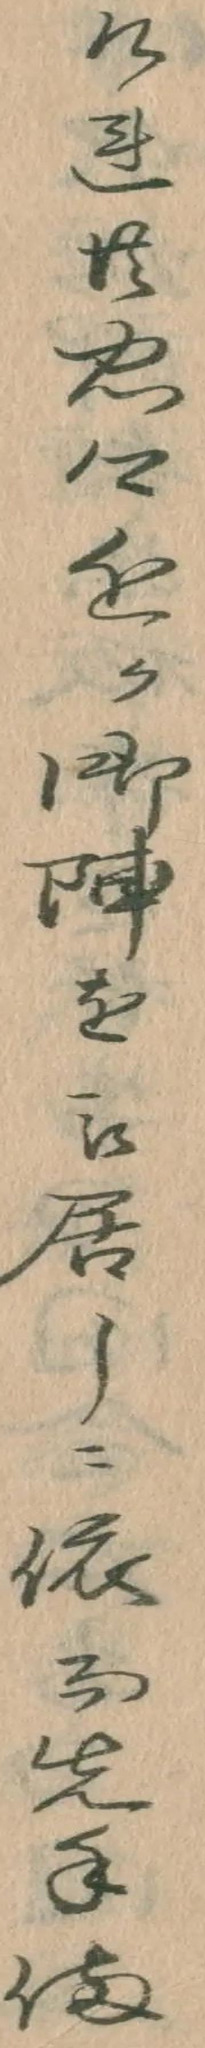け連共忠郷近く御陣を被居しに依而先手備
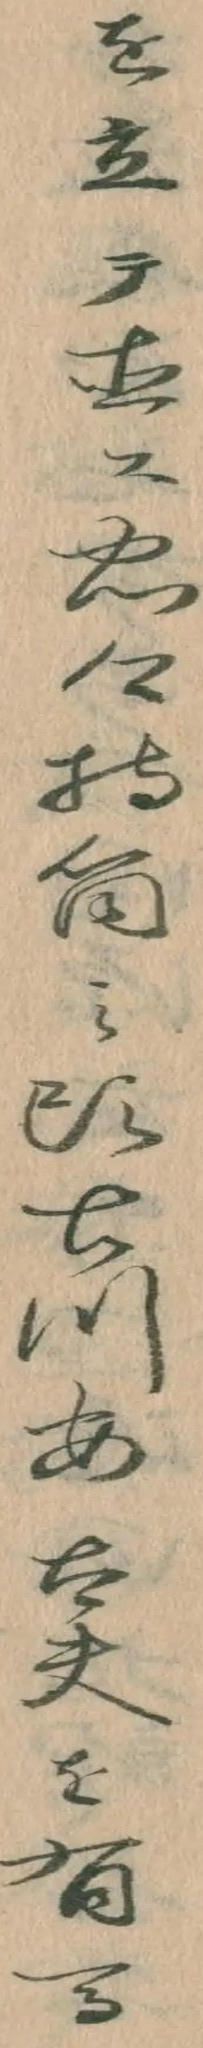を立て直す忠郷持筒之頭古川安太夫を有馬
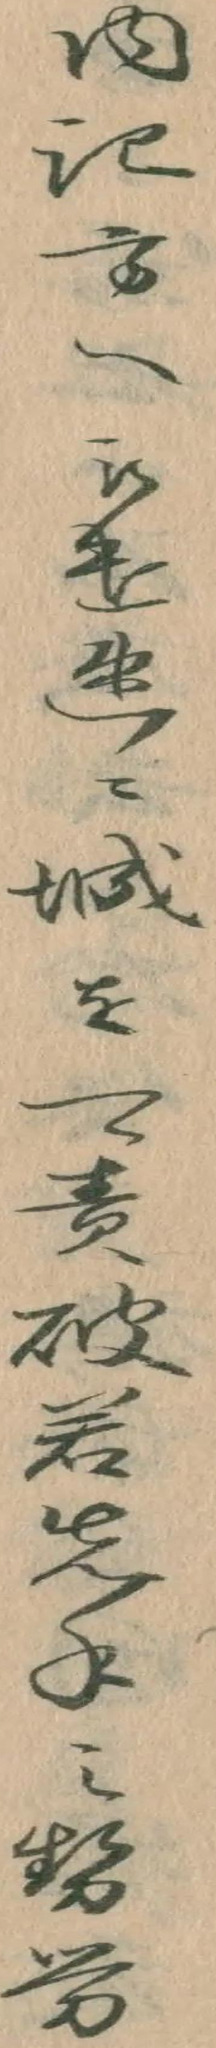内記方へ被遣速に城を可責破若先手之勢労
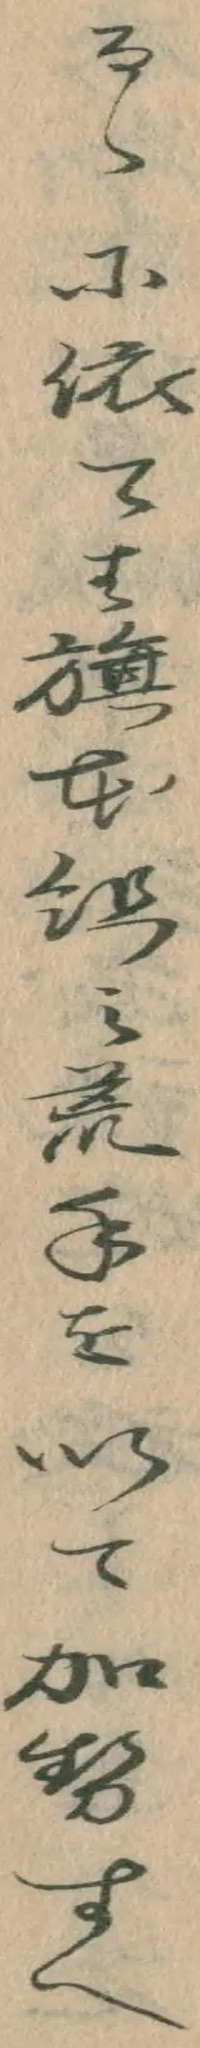るゝ尓依て者旗本組之荒手を以て加勢すへ
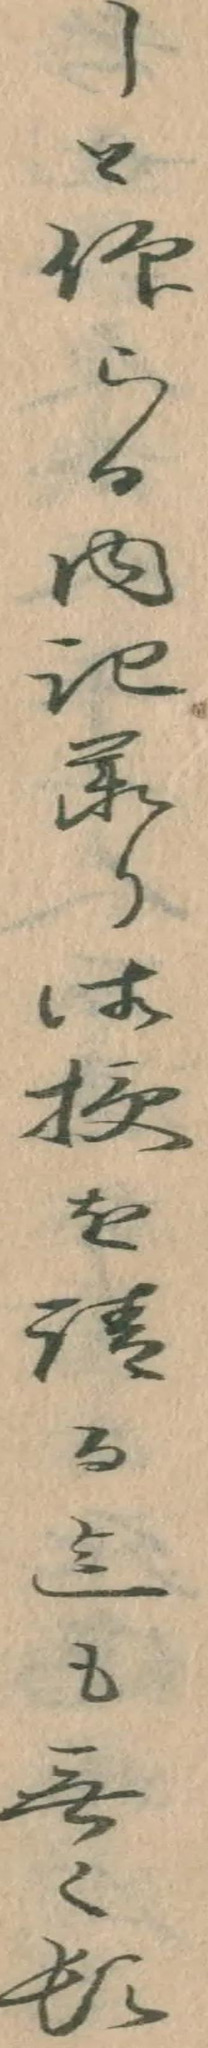しと仰らる内記承り御様を請る迄も無く頓
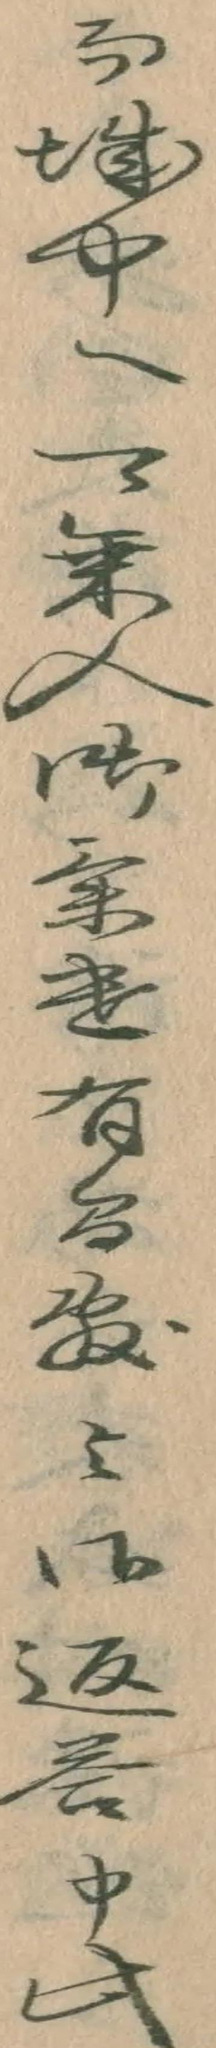而城中へ可乗入御気遣有間敷与御返答申此
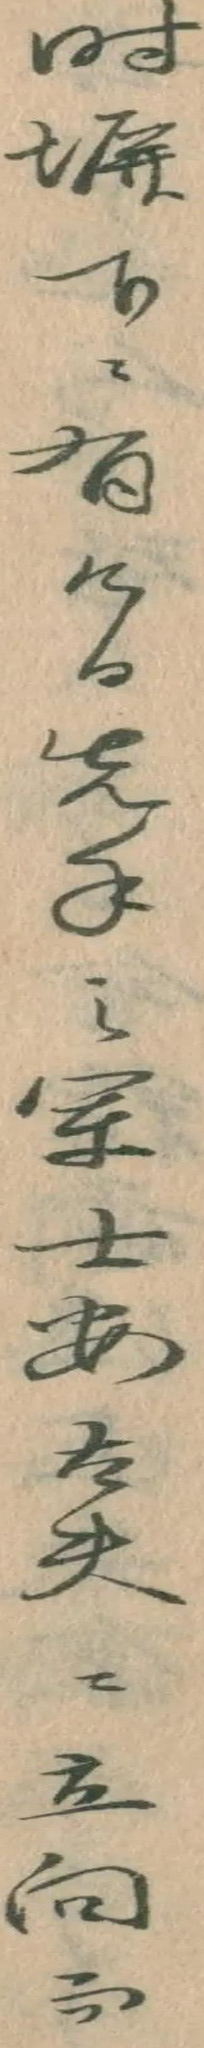時塀下に有ける先手之軍士安太夫に立向而
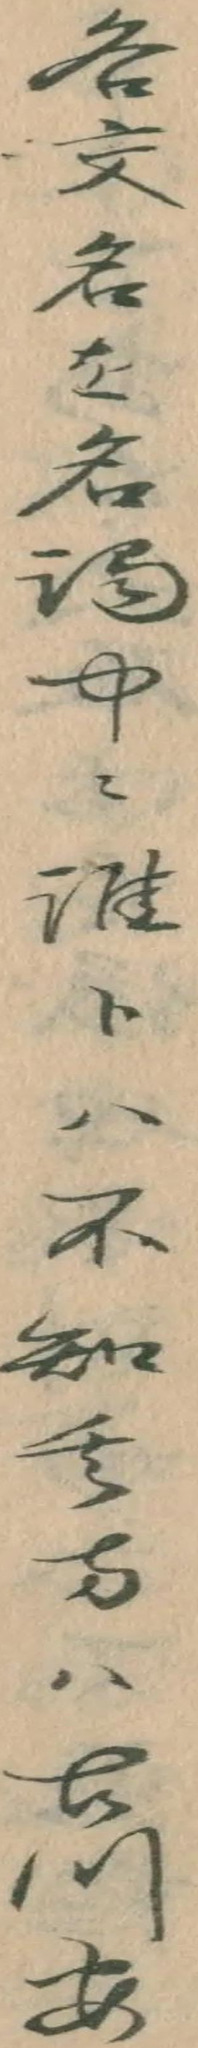各交名を名謁中に誰とは不知其方は古川安
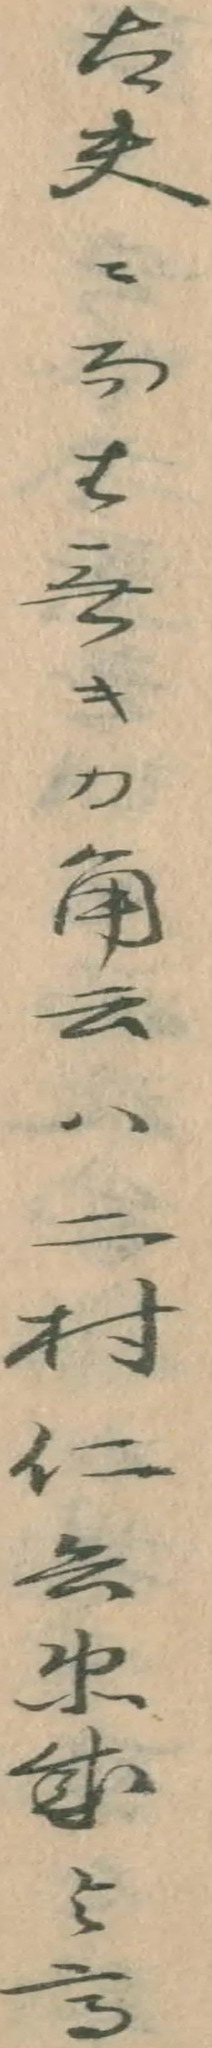太夫に而者無きか角云は二村仁兵衛成与高

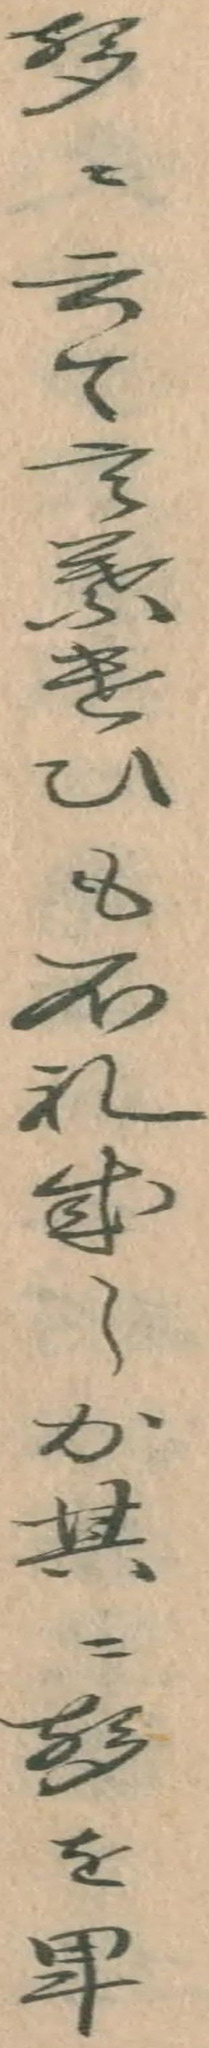声に云て言葉遣ひも不礼成しか其に声を卑
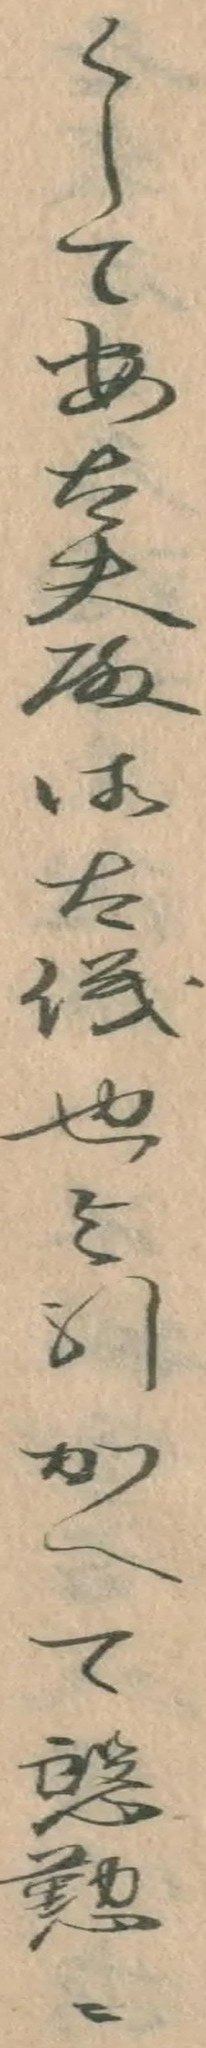くして安太夫殿御太儀也与引かへて慇懃に
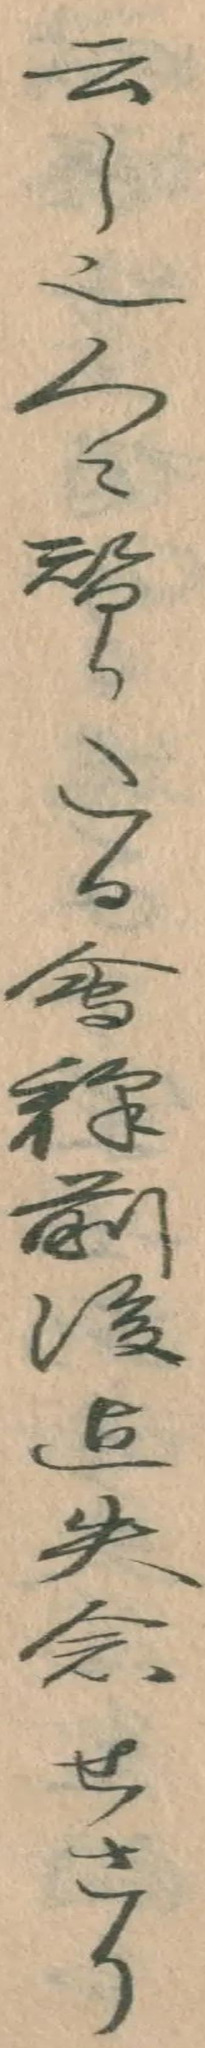云し也人に替りたる会釈前後迄失念せさり
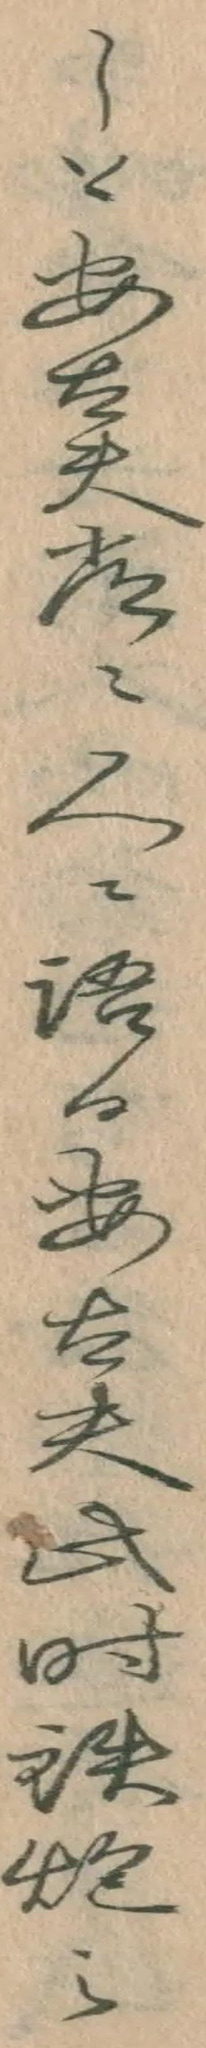しと安太夫常々人に語る安太夫此時鉄炮之
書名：切支丹御退治記 49巻. [5]
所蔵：国立国会図書館 National Diet Library, JAPAN
